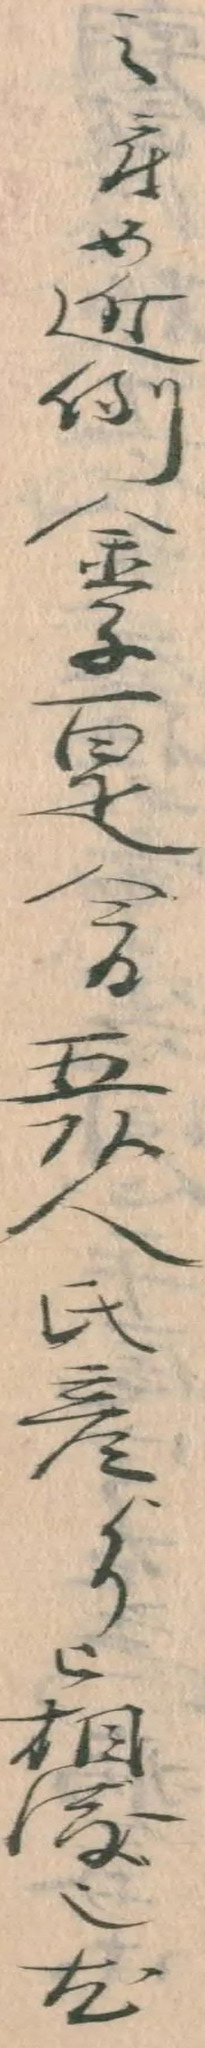之ニ付如近例金子百疋今日五頭人氏彦より被相渡也尤
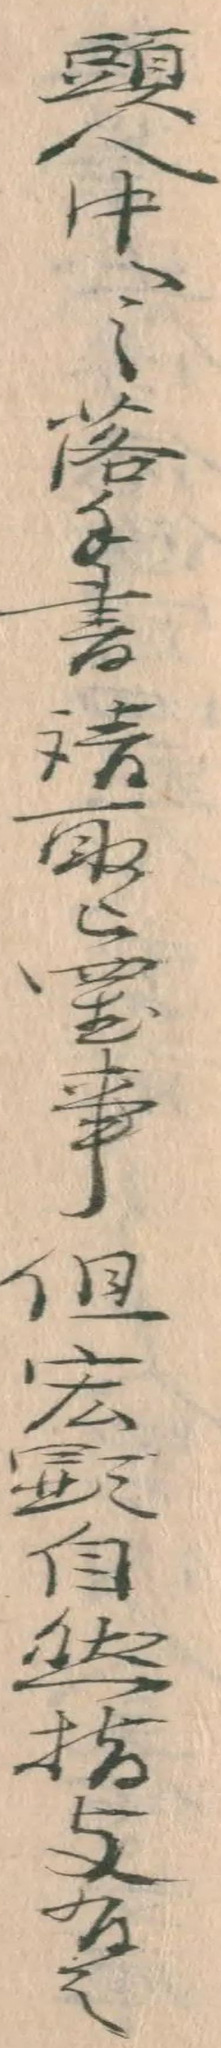頭人中へ之落手書請取被置事但宏顕自然指支有之
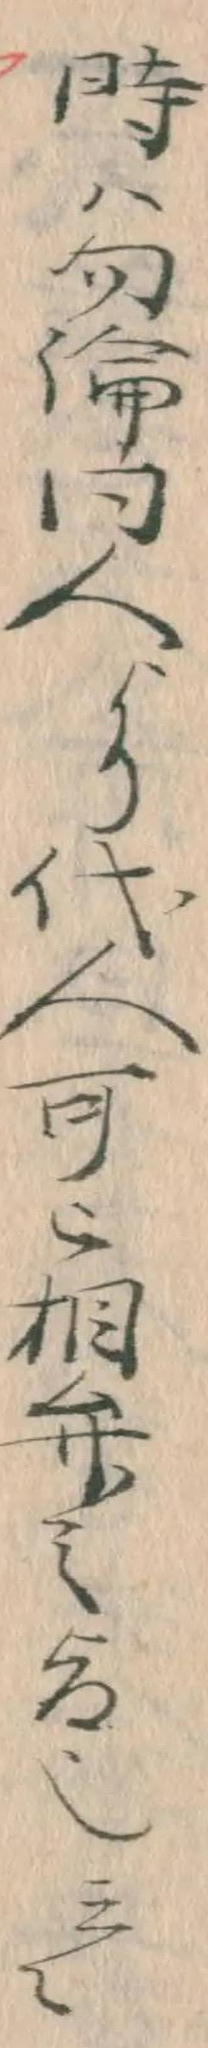時ハ勿論同人より代人可被相弁之旨也云々
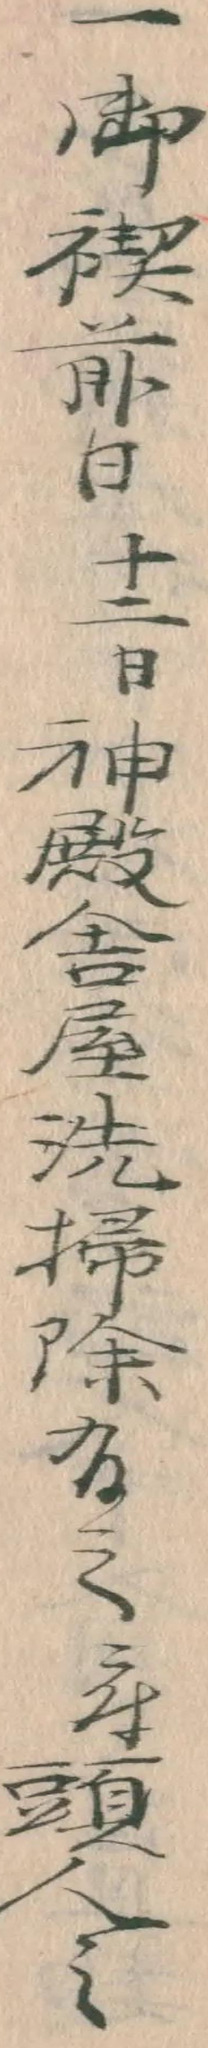一御禊前日十二日神殿舎屋洗掃除有之ニ付頭人之
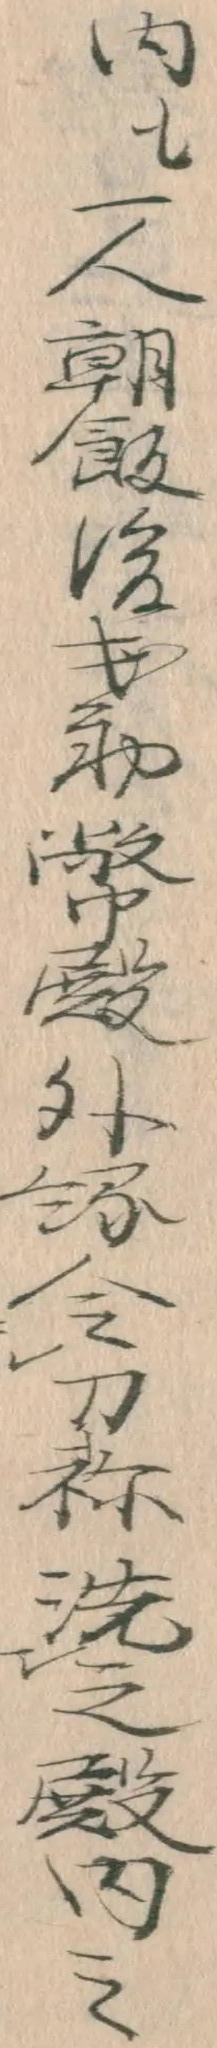内も一人朝飯後出勤幣殿外縁令刀祢洗之殿内之
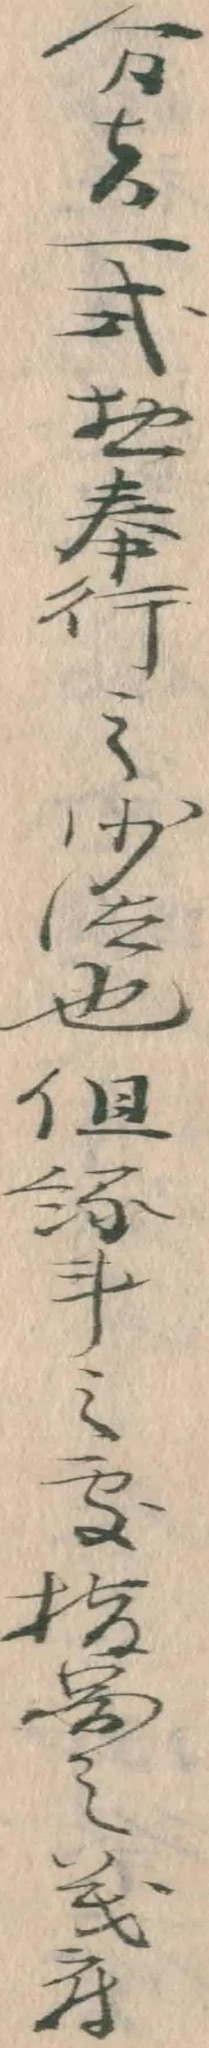分者一式惣奉行之沙汰也但縁斗之處指図之義ニ付
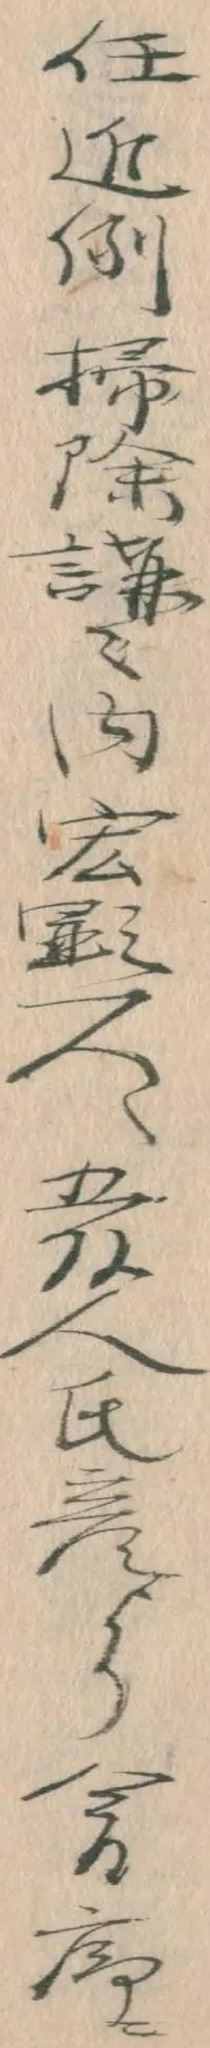任近例掃除講之内宏顕一人へ五及人氏彦より今序ニ
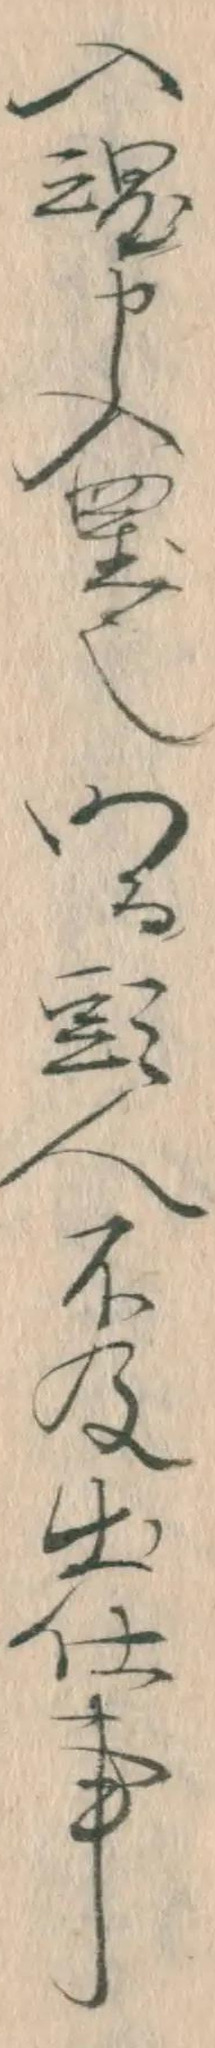入魂申入置也仍而頭人不及出仕事
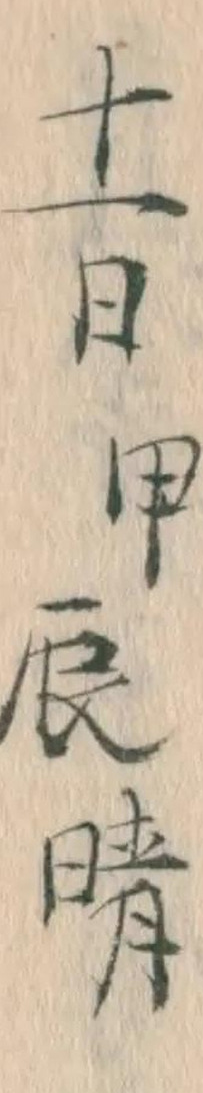十一日甲辰晴
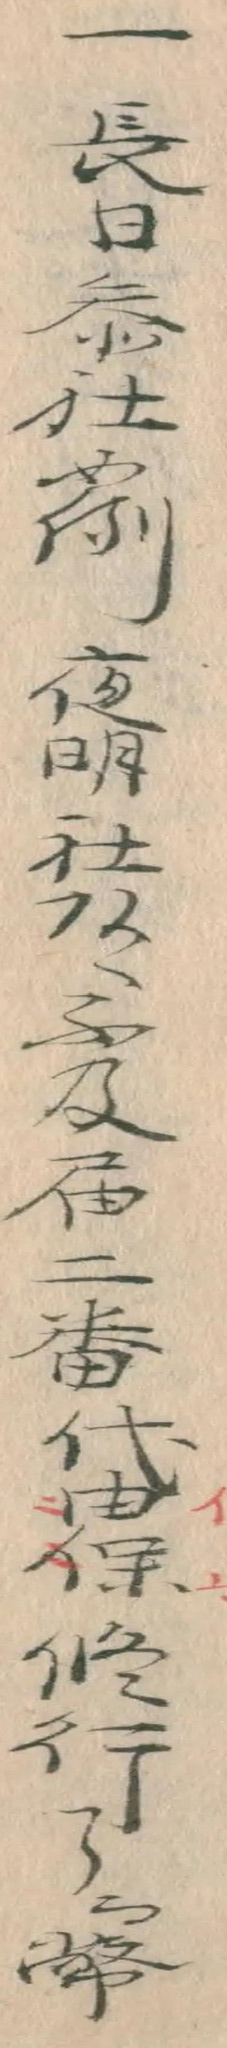一長日参社如例夜明社頭へ不及届二番代由保修行了而幣
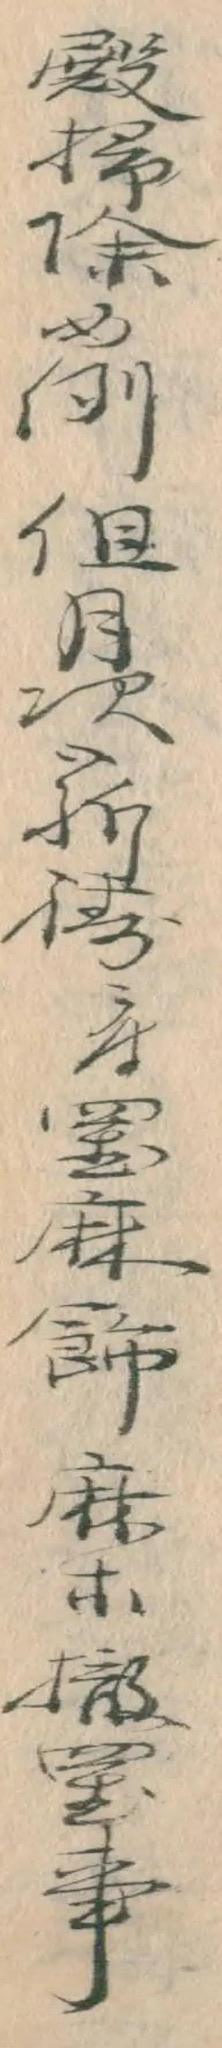殿掃除如例但月次御祈祷ニ付置麻飾麻等撤置事

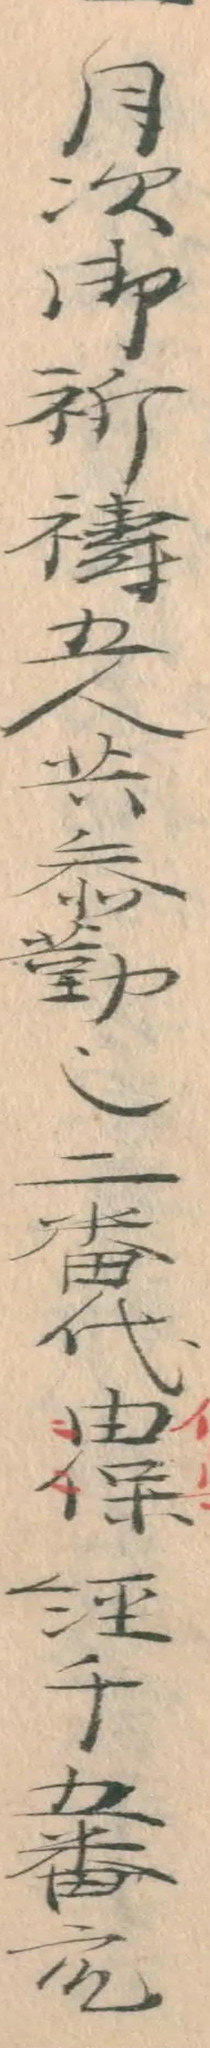一月次御祈祷五人共参勤也二番代由保経千五番衆
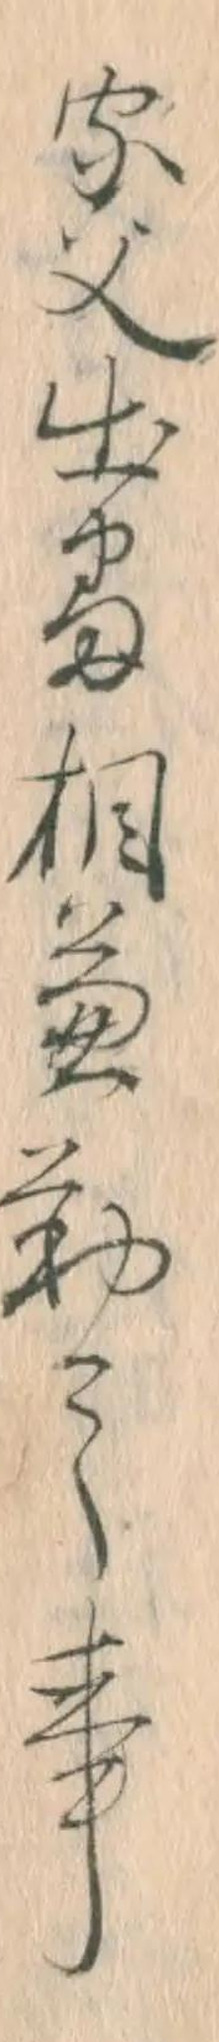家父出番相兼勤之事
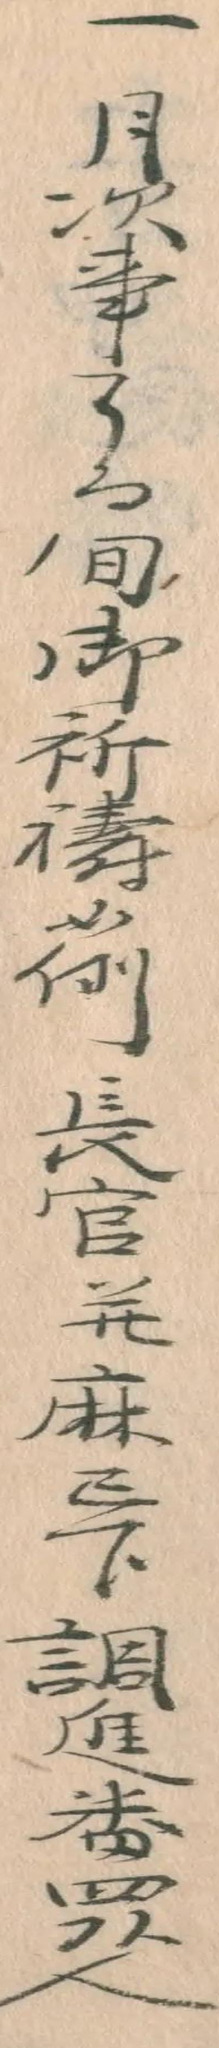一月次事了而旬御祈祷如例長官并麻已下調進番四頭人
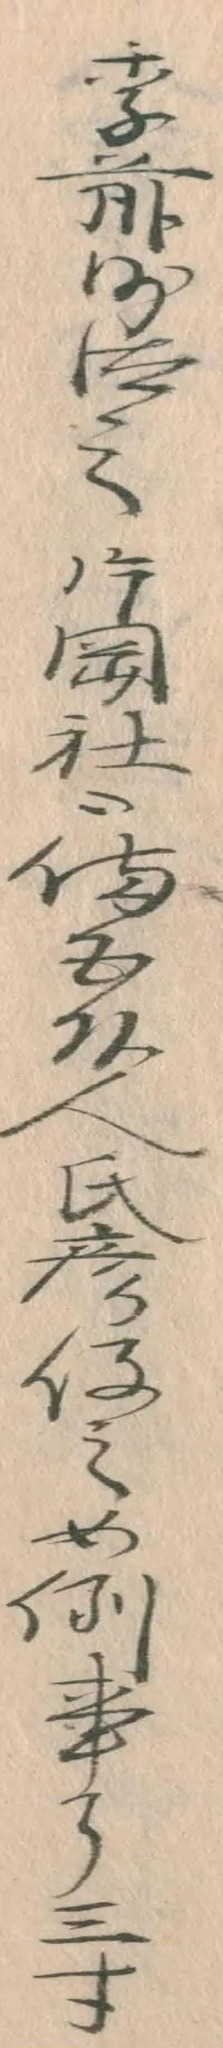季前沙汰之片岡社御備五頭人氏彦役之如例事了三寸
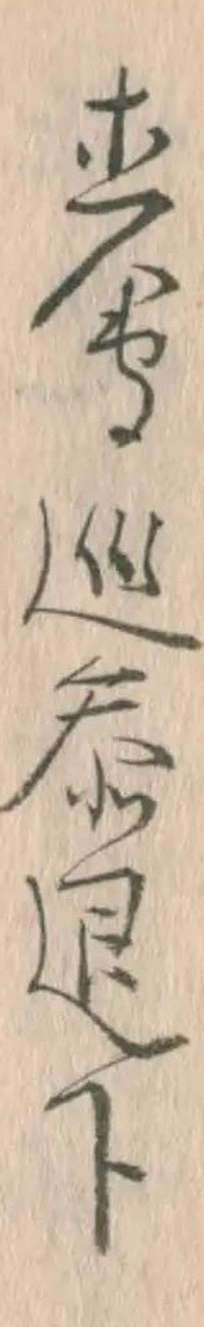直會巡参退下
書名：賀茂社記録. 第73冊
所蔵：国立国会図書館 National Diet Library, JAPAN
